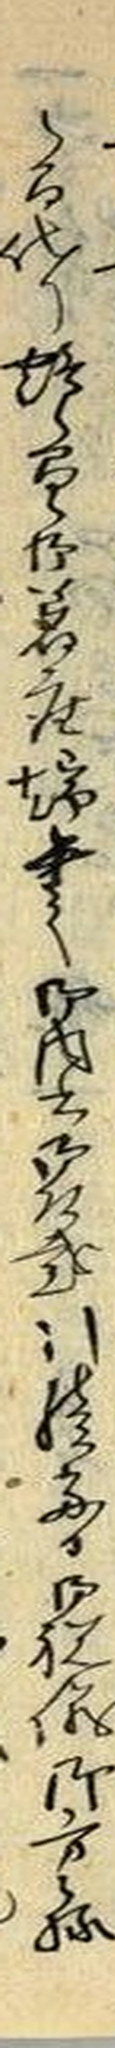之間代り鶴之間へ御着座端午之御内書御頂戴引続当日御祝儀御方々様
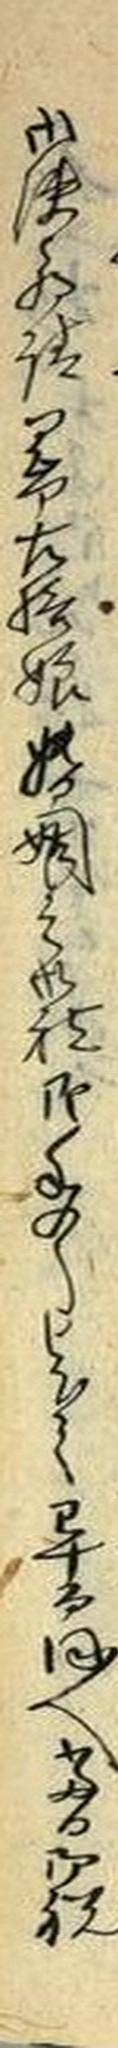御使被為請岡部左膳娘婚姻之御礼御手のし被下之畢而同人当日御祝
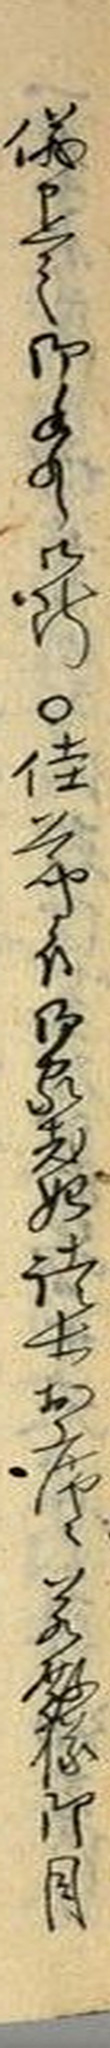儀申上之御手のし同断○佳節ニ付御家老始諸士於席ニ若殿様御目
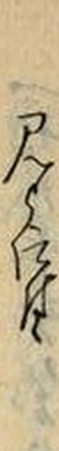見被仰付候
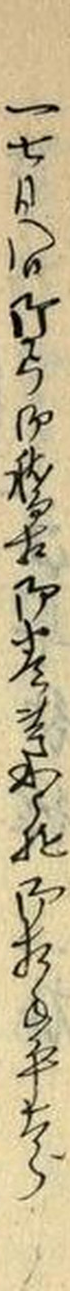一七月八日御弓御稽古御巻藁被遊御相手平太郎
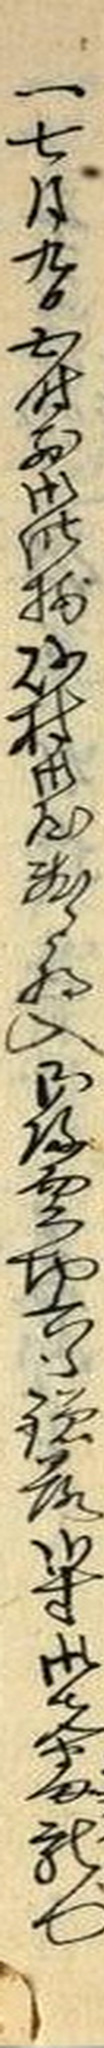一七月九日五時前御供揃砂村御屋敷へ被為入御帰殿切六ツ鎰落弐寸御先番当番ゟ新右衛門
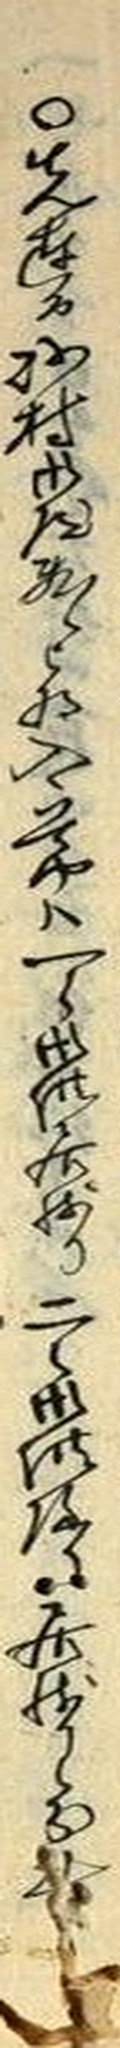○先達而砂村御屋敷へ被為入候節ハ一日御供居残り二日之御供帰り居残り之分斗
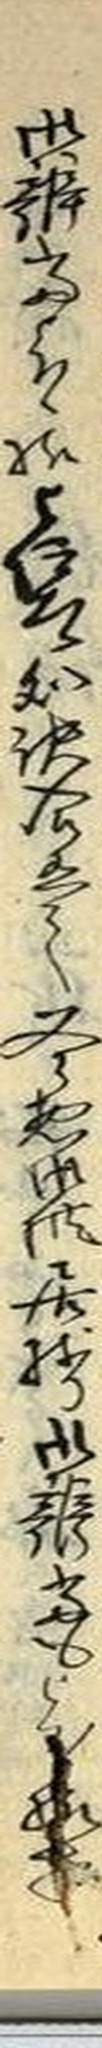御弁当被下候様被仰出候処訳合有之又々惣御供居残り御弁当も被下様相
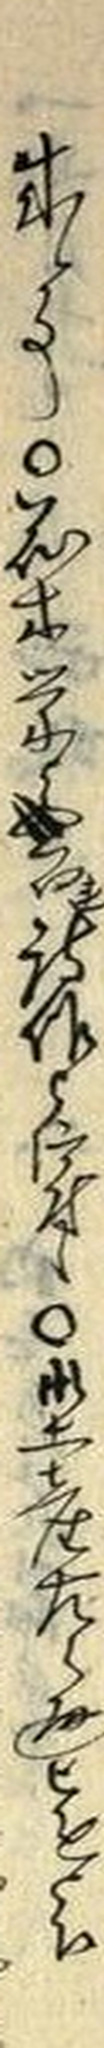成候事○花木栄被召連詩作被仰付候○御土産左之通被進被下
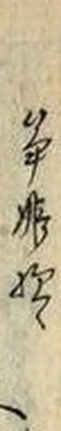箏姫様へ

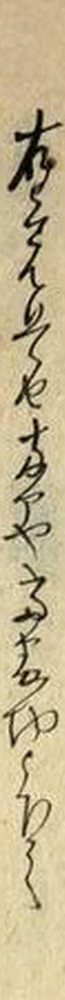右差上候由両部や当番切被下之
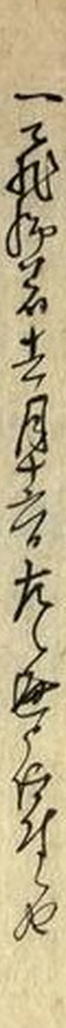一飛脚着去月十六日左之通被仰付候由
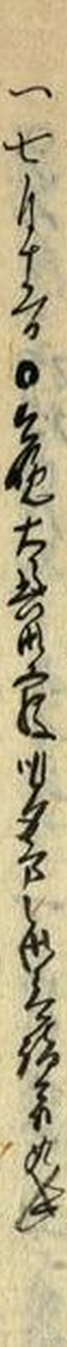一七月十二日〇今晩大奥御寝明夕方之御参詣ニ付如此
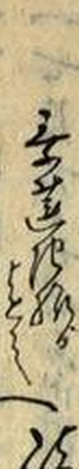乗蓮院様ゟ
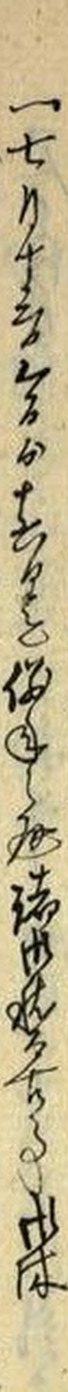一七月十三日今日ゟ十六日迄例年之通諸御稽古事御休
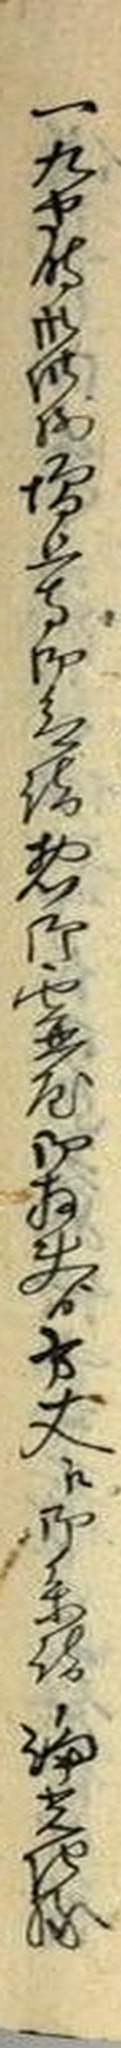一九半時御供揃増上寺御参詣惣御霊屋御拝夫ゟ方丈江御参詣浄光院様
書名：少傅日録抄（斉承付側向頭取日記、在府）
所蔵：福井県文書館 Fukui Prefectural Archives
